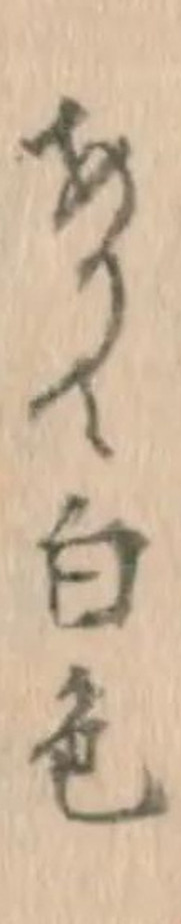ありて白色
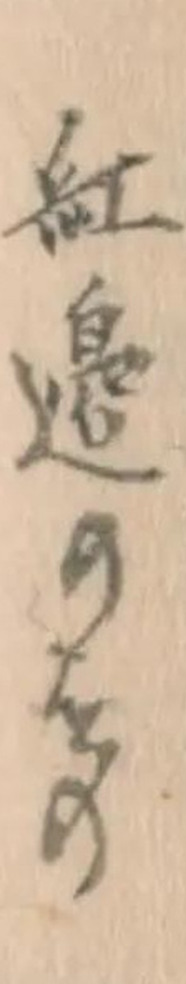紅辺のもの
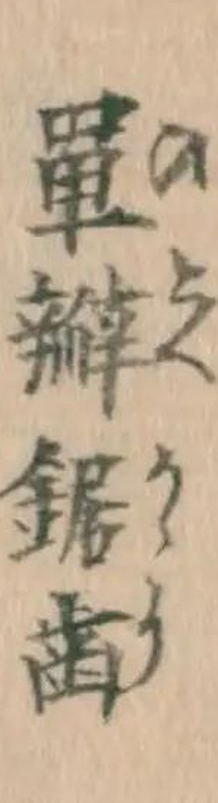単弁鋸歯
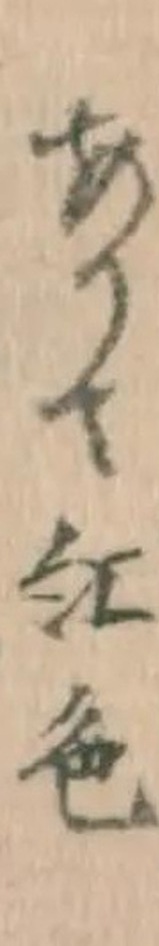ありて紅色
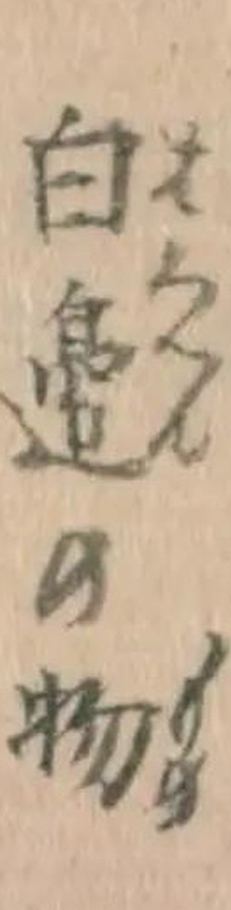白辺の物

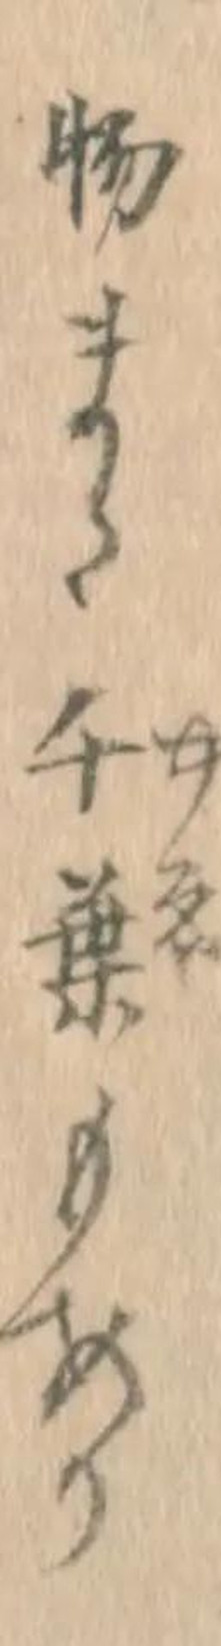物また千葉もあり
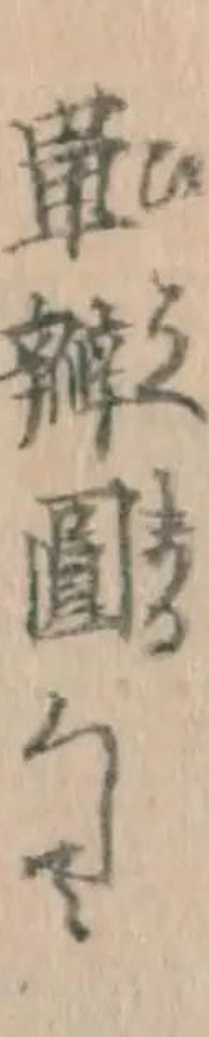単弁円くして
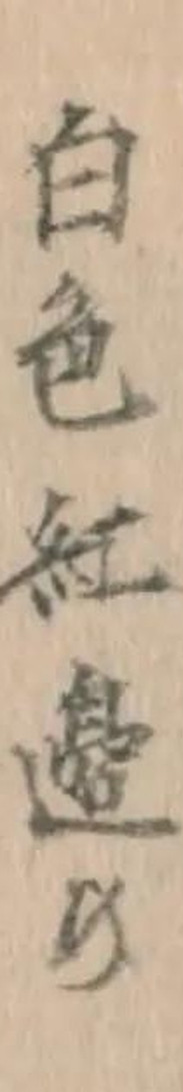白色紅辺の

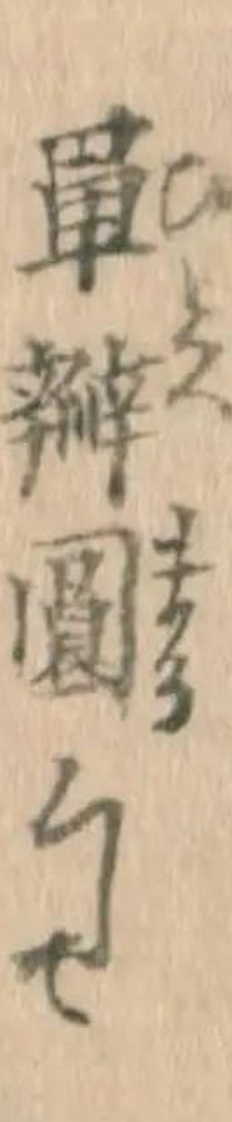単弁円くして
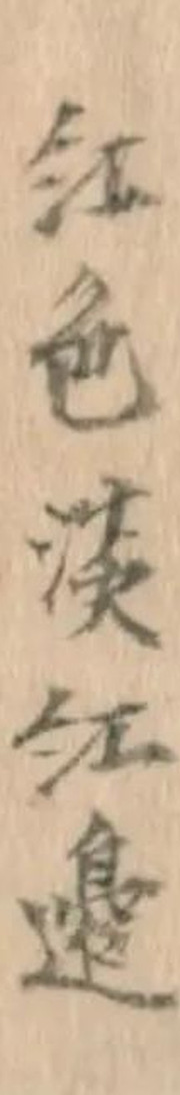紅色淡紅辺
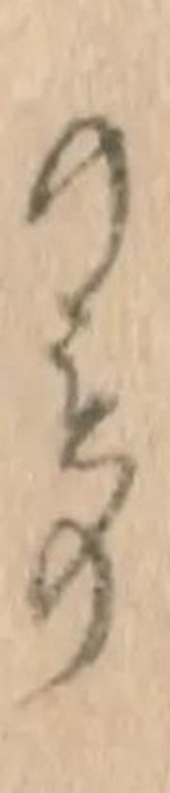のもの
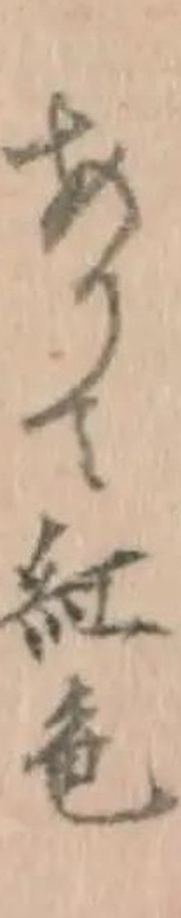ありて紅色
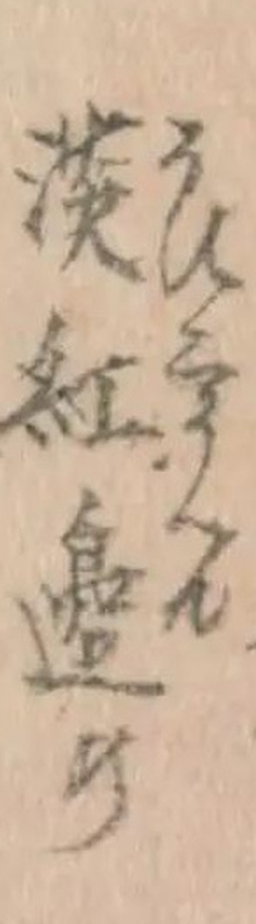淡紅辺の

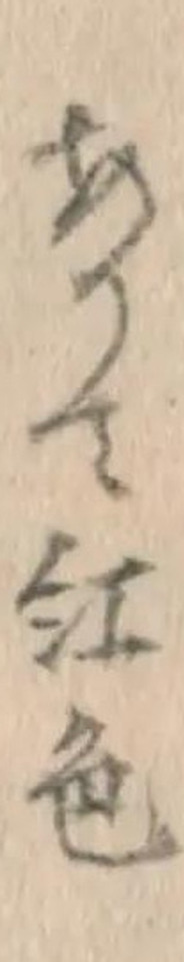ありて紅色
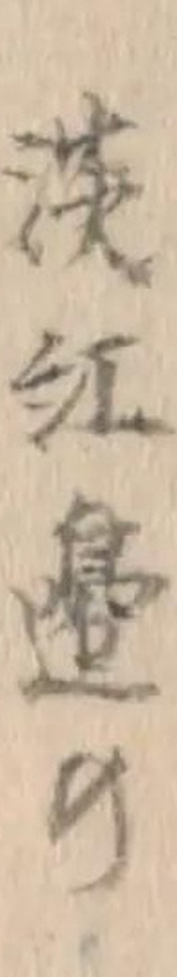淡紅辺の
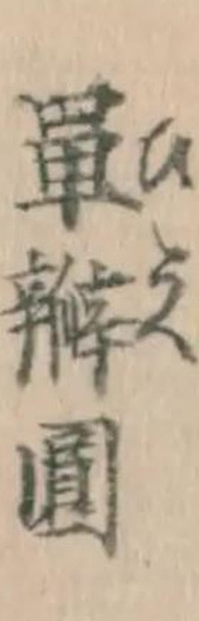単弁円
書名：本草図譜. 巻40-42
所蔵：国立国会図書館 National Diet Library, JAPAN
